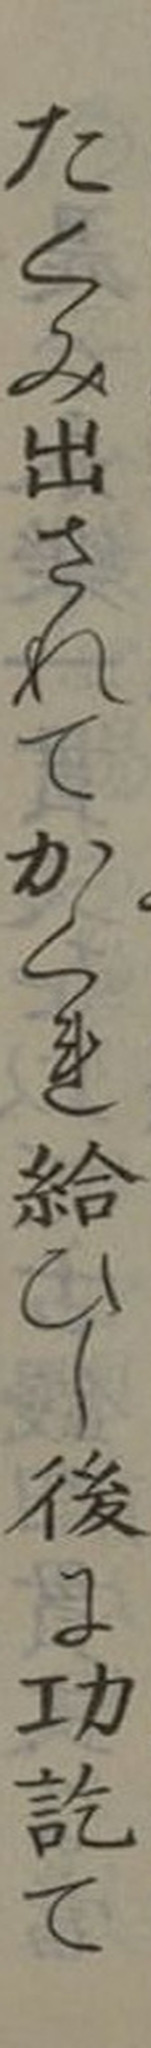たくみ出されてかくれ給ひし後に功訖て
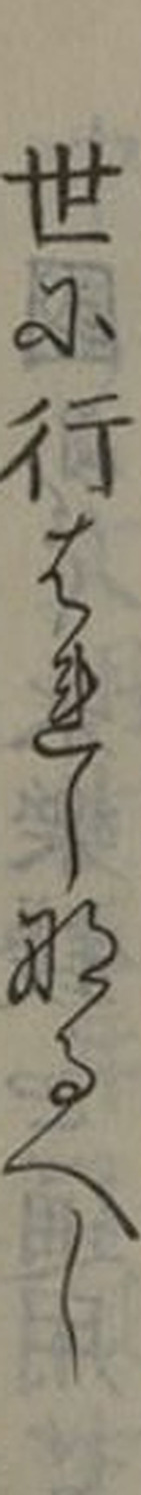世に行はれしなるへし
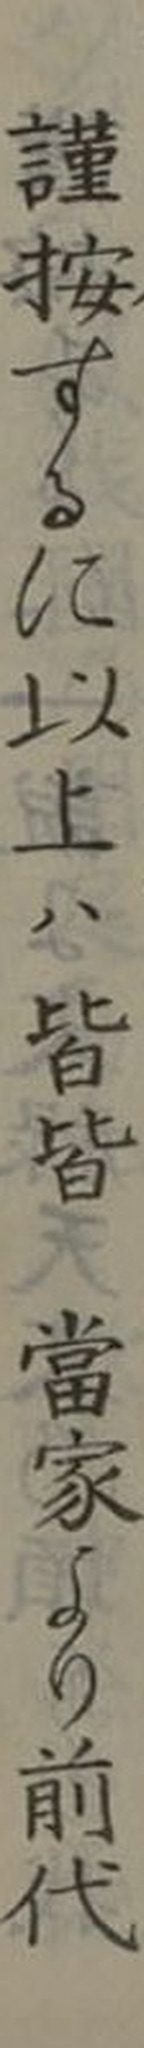謹按するに以上は皆皆當家より前代
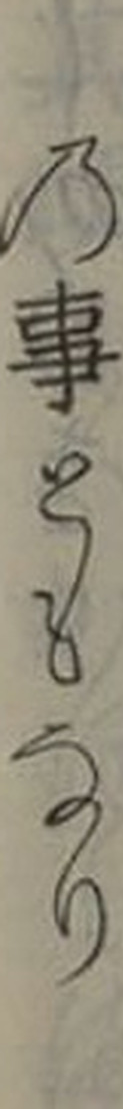の事ともなり
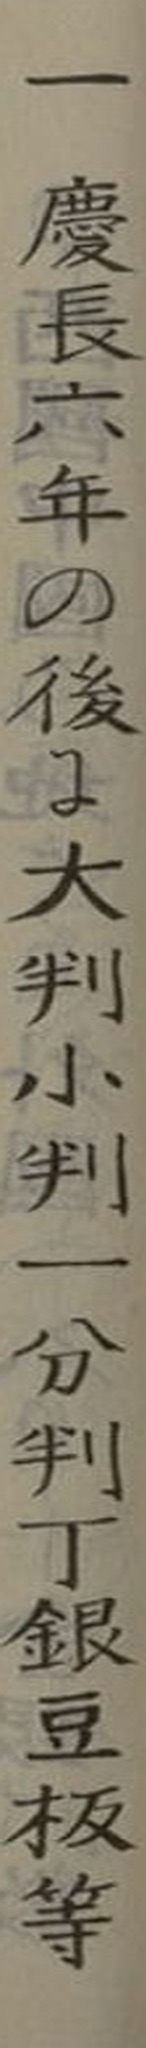一慶長六年の後に大判小判一分判丁銀豆板等
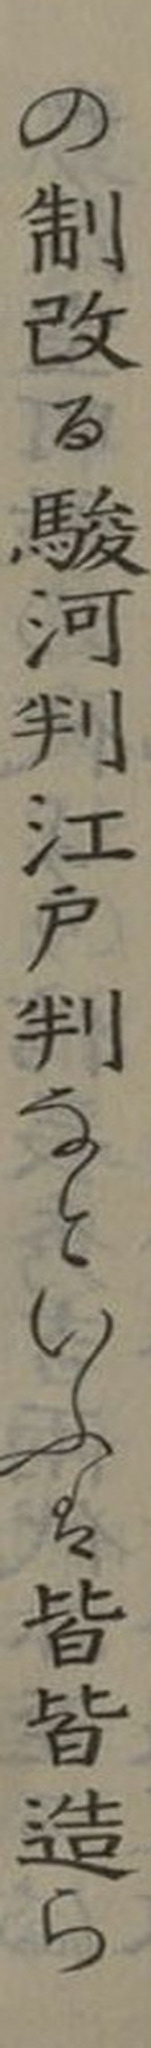の制改る駿河判江戸判なと皆皆造ら
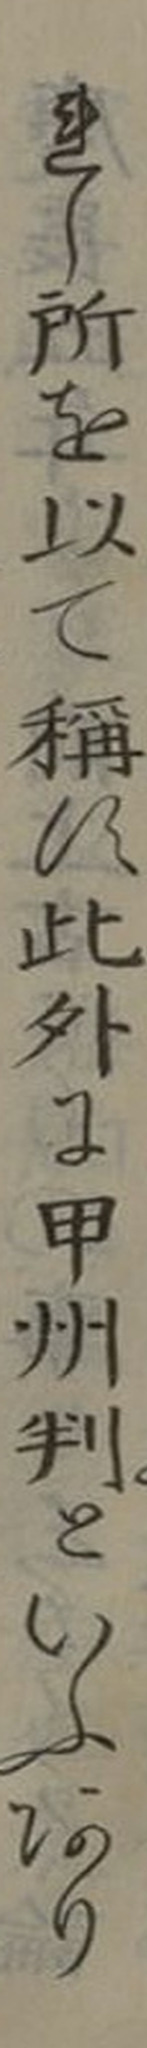れし所を以て稱す此外に甲州判といふあり
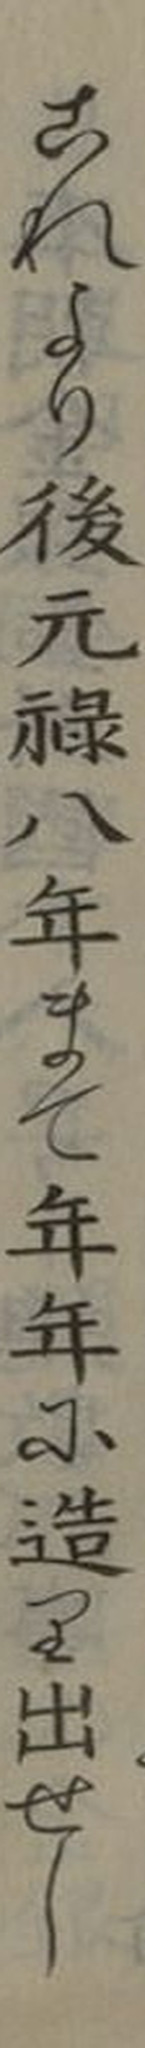これより後元緑八年まて年年に造り出せし
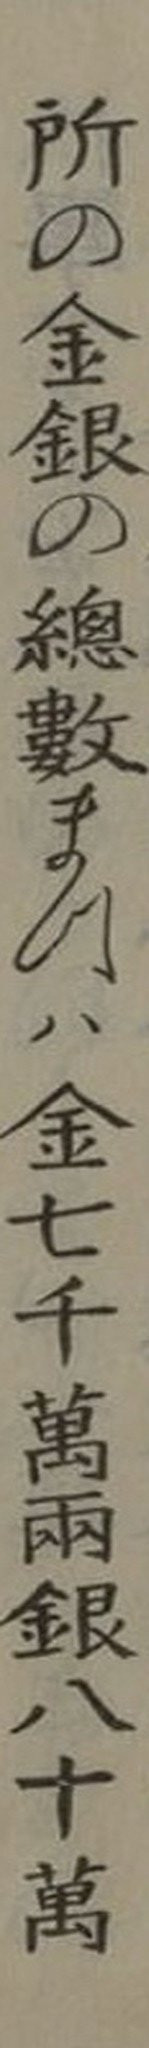所の金銀の總數まつは金七千萬兩銀八十萬
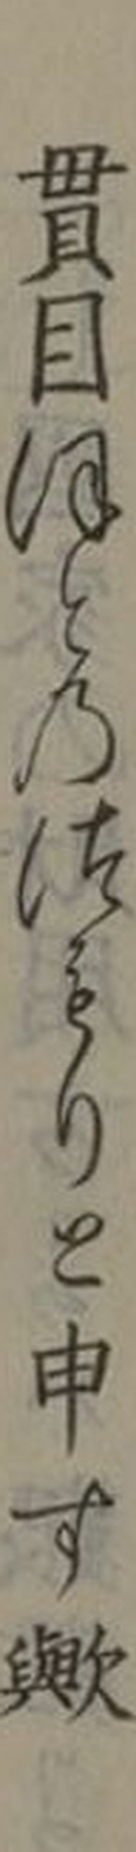貫目ほとのつもりと申す歟
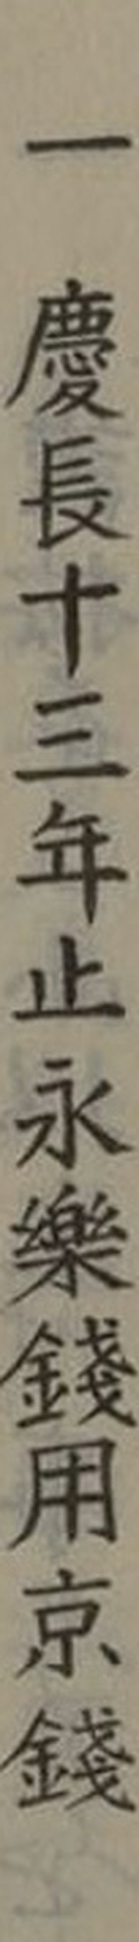一慶長十三年止永樂錢用京錢
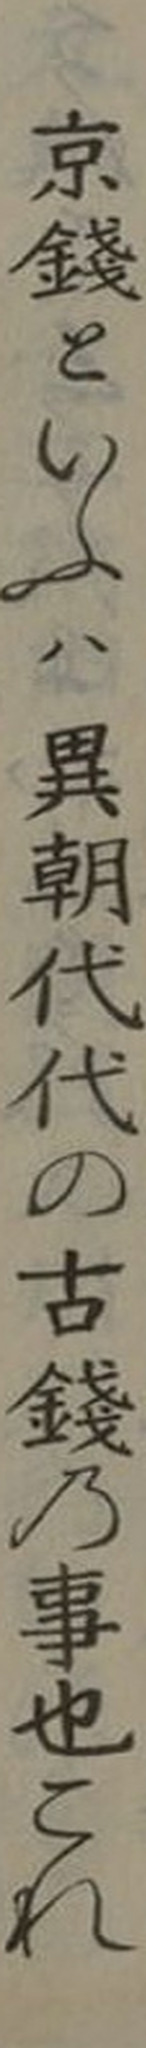京錢といふは異朝代代の古錢の事也これ
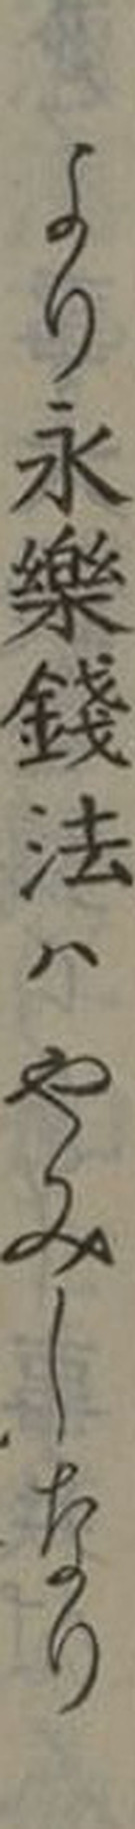より永樂錢法はやみしなり
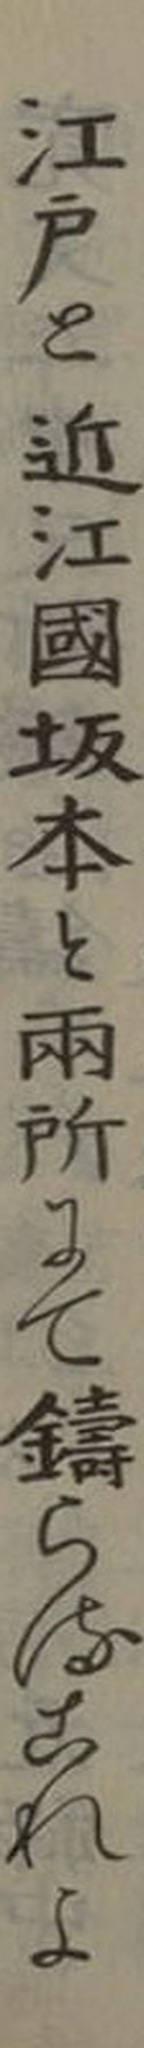江戸と近江國坂本と兩所にて鑄らるこれよ
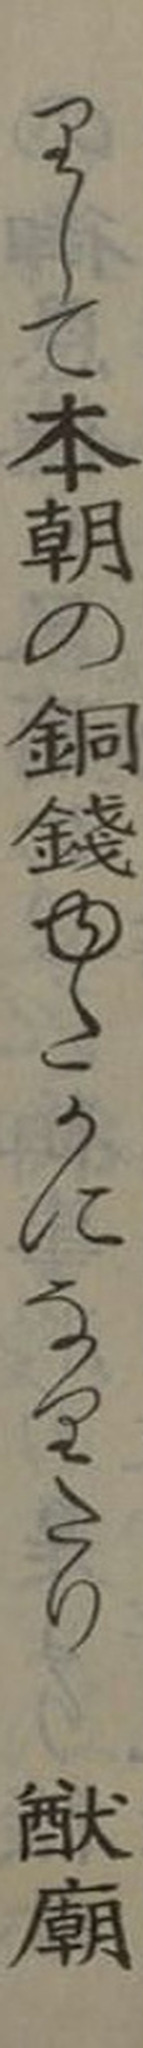りして本朝の銅錢ゆたかになりたり猷廟

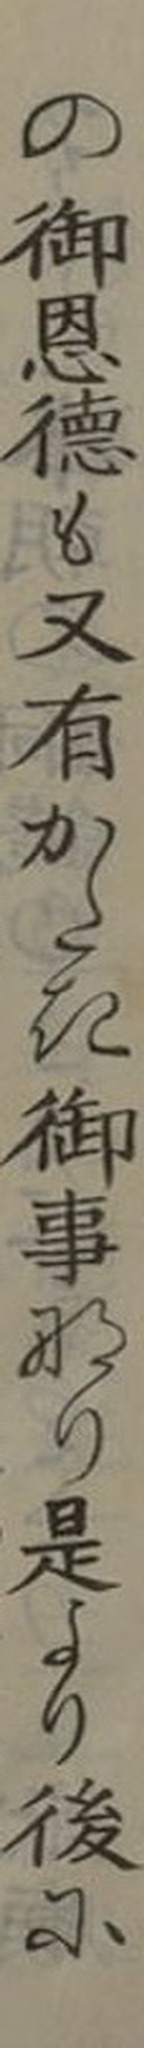の御恩德も又有かたき御事なり是より後に
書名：骨董録
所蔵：University of the Ryukyus Library
